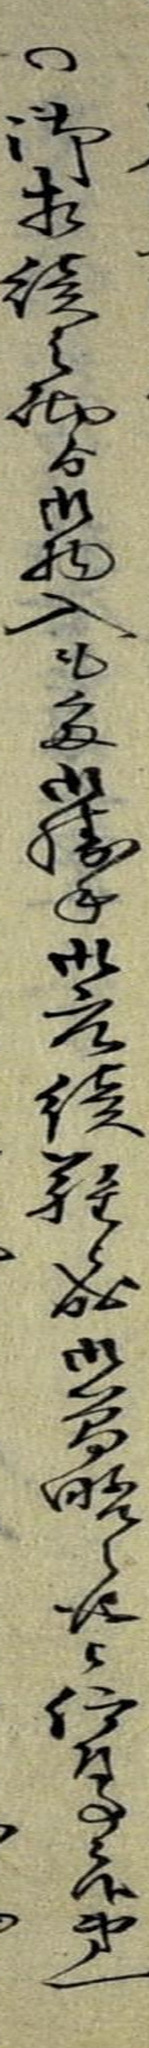〇御相続之砌ゟ御物入も多御勝手御取続難被成御簡略之儀被仰付事ニ候第一
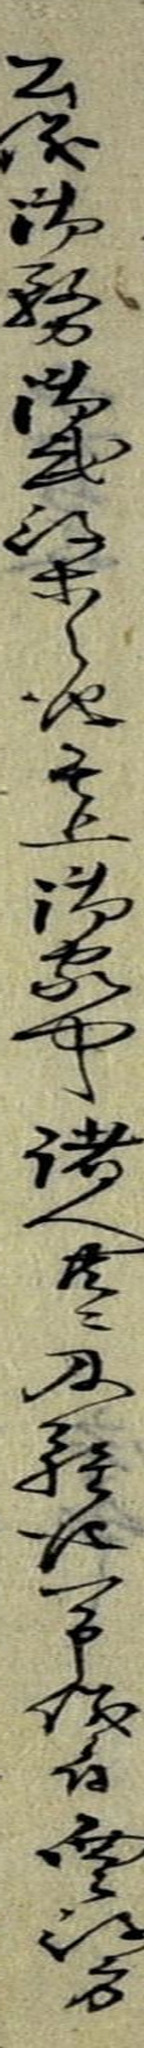公儀御務御武役等之儀其上御家中諸人共ニ及難儀可申儀ニ付面々役方
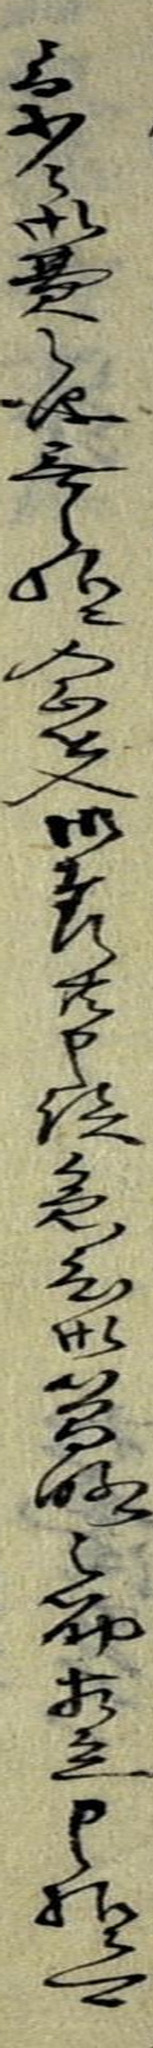ニ而少々御費之儀無之様ニ念を入御奉行共申談急度御簡略之筋相立申様ニ可
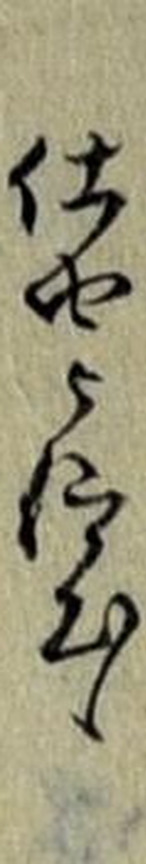仕由被仰出候
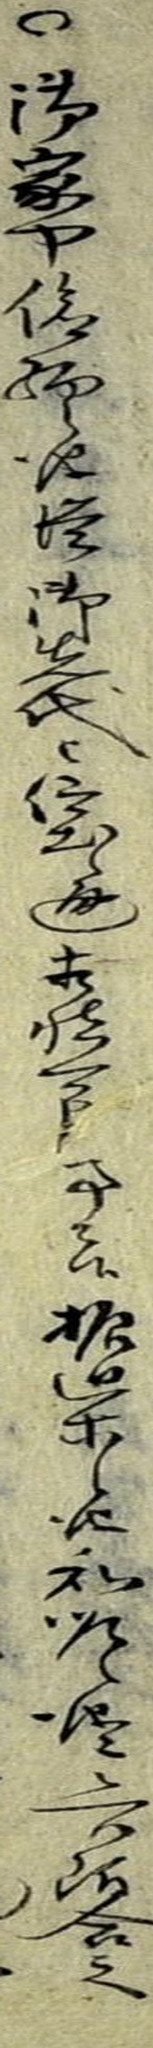〇御家中倹約之儀従御先代被仰出候通相慎可申事ニ候振廻等之儀和順之儀ニ候ヘハ附合之
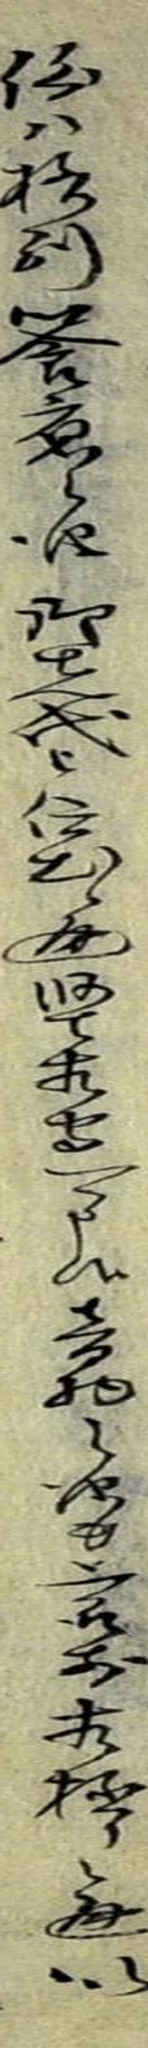儀ハ格別饗応之儀御先代被仰出候通堅相守可申候音物之儀も最前相極り候通以
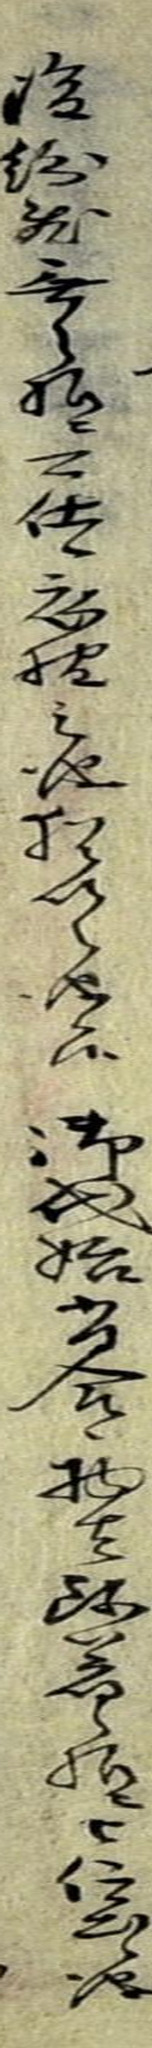後紛敷無之様ニ可仕候衣服之儀猶以之儀ニ候御代始有合候物者致着候様ニ被仰出候儀
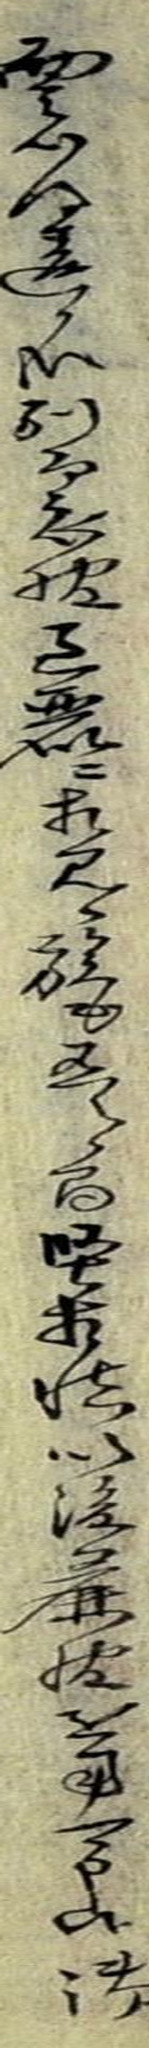面々心得違候哉別而衣服過麗ニ相見候族も有之候間堅相慎以後麁服を用可申候御
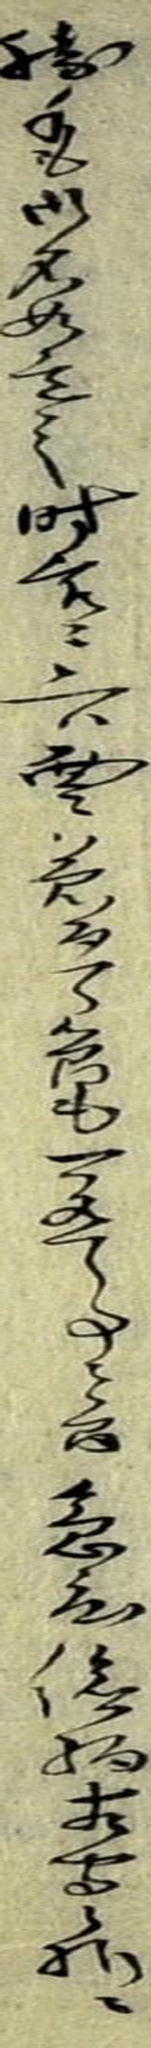勝手も御不如意之時節ニ候ヘハ面々兼而了簡も可有之事ニ候間急度倹約相守候様ニ
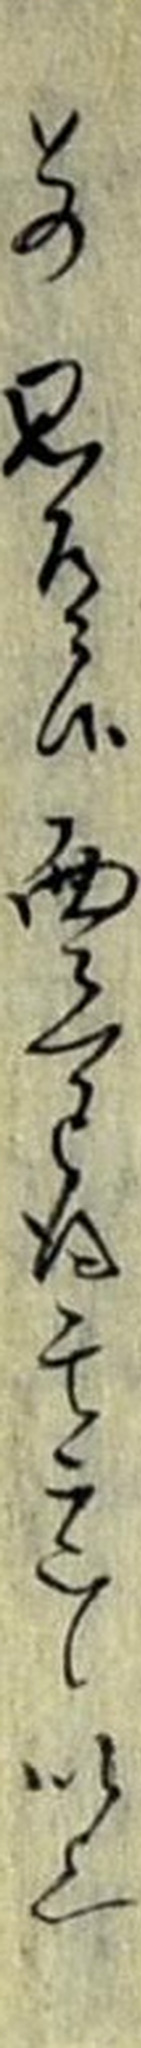との思召ニ候面々可被得其意候以上
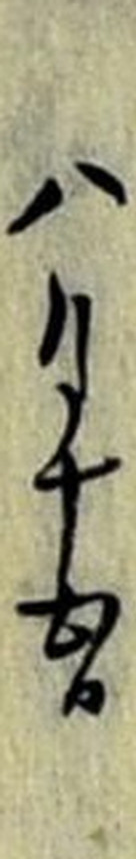八月十五日
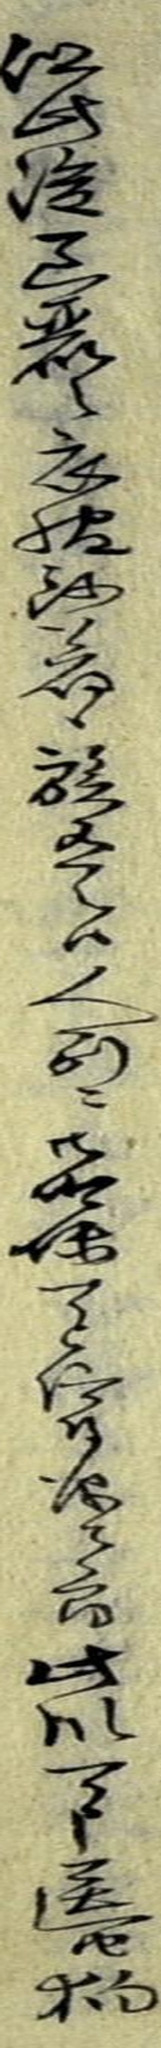但此後過麗之衣服致着候族有之ハ人別ニ御吟味可被仰付儀ニ候間此段可申送由狛

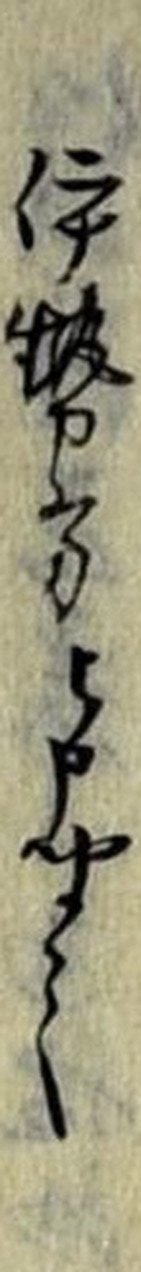伊勢方被申聞之
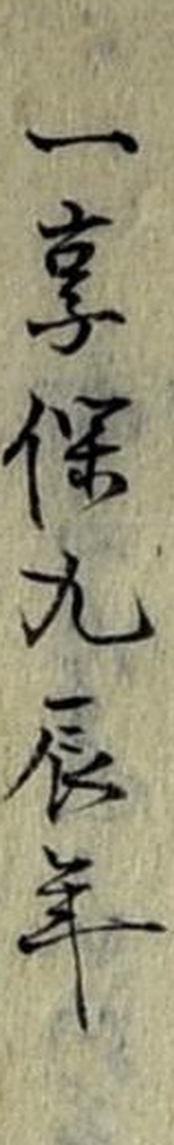一享保九辰年
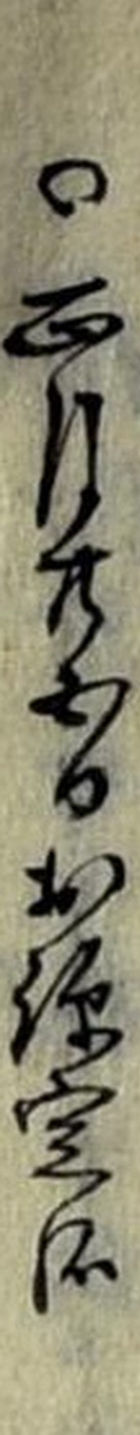〇正月廿五日於評定所
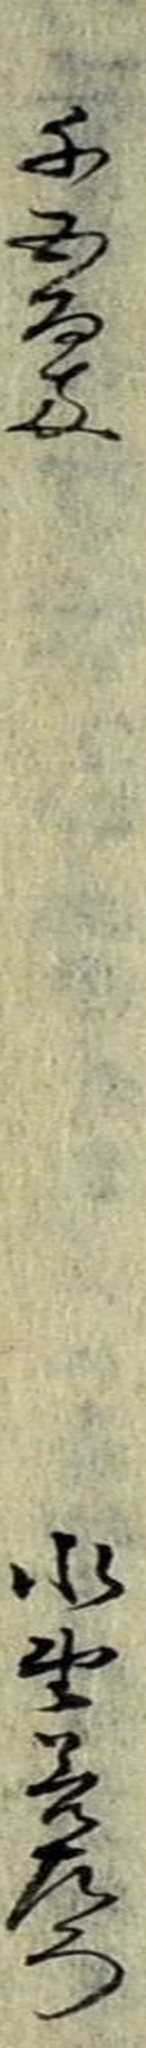千五百両水野善左衛門
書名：命令之部 一
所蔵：福井県文書館 Fukui Prefectural Archives
